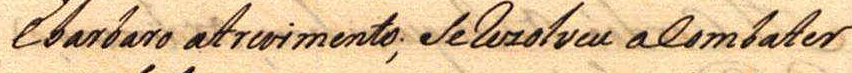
& barbaro atrevimento; se Resolveu a combater
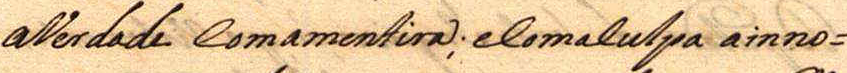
a Verdade com a mentira; e com a Culpa a inno
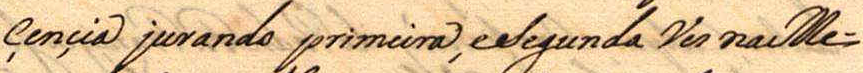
çençia jurando primeira, e Segunda Ves na Me
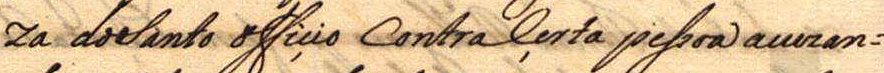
za do Santo offiçio Contra Çerta pessoa acuzan
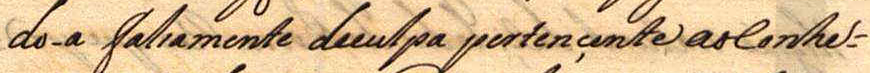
do-a falsamente de culpa pertençente ao Conhe
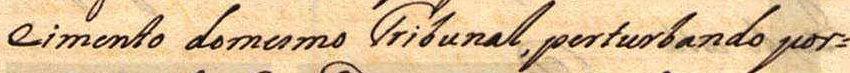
cimento do mesmo Tribunal, perturbando por
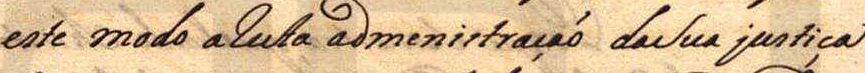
este modo a Recta admenistraçaõ da sua justiça
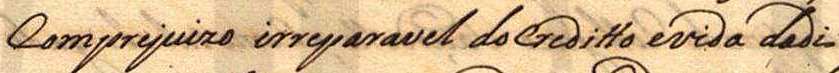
Com prejuizo irreparavel do creditto e vida da di
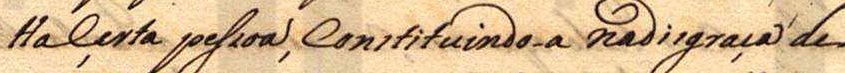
tta Çerta pessoa, constituindo-a na disgraça de
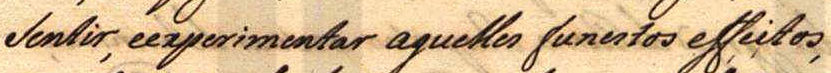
sentir, e experimentar aquelles funestos effeittos,
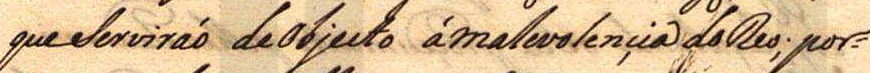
que serviraõ de objecto á malevolençia do Reo; por
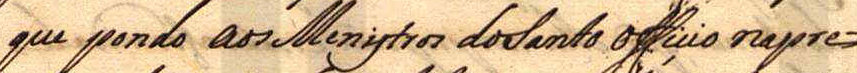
que pondo aos Menistros do Santo offiçio na pre
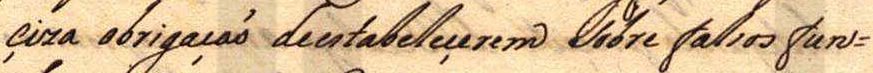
çiza obrigaçaõ de estabeleçerem sobre falsos fun
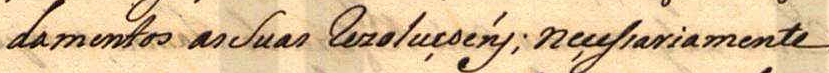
damentos as suas Resoluçoen̄s; neçessariamente
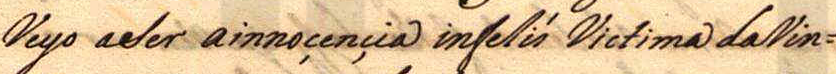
Veyo a Ser a innoçençia infeliz Victima da Vin
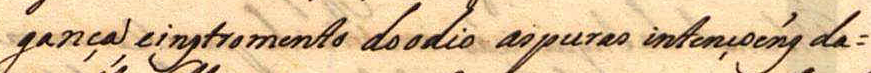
gança, e instromento do odio as puras intençoen̄s da
